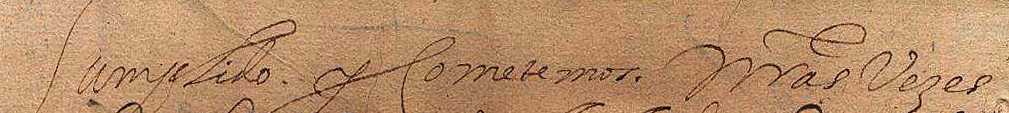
Cumplido y Cometemos. nr̄as vezes
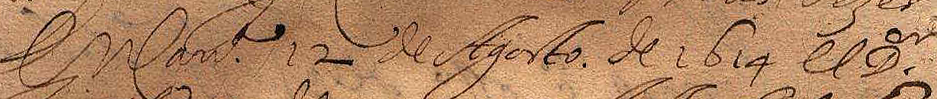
en Can.a 12 de Agosto de 1614 el D.or
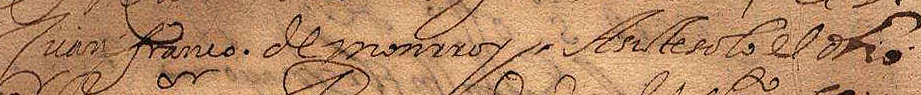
Juan franco. de monrroy. Ante solo el dho
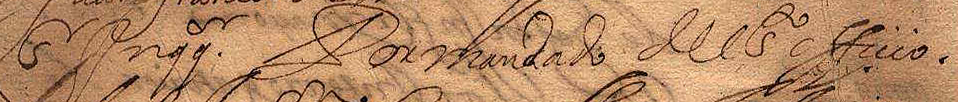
sr Jnqq.or Por mandado del sto officio.
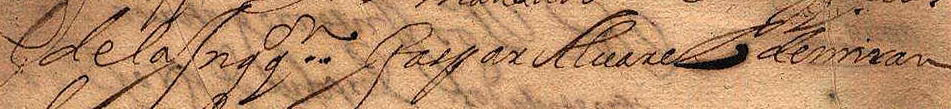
de la Jnqq.on Gaspar Aluarez de miran
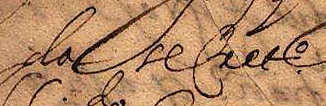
da secreto.
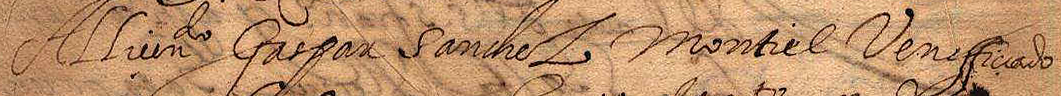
Alluindo Gaspar sancheZ montiel Venefficiado
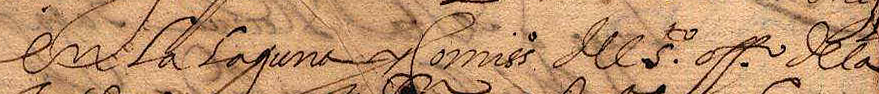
en la laguna y Comisso del s.to off.o de la
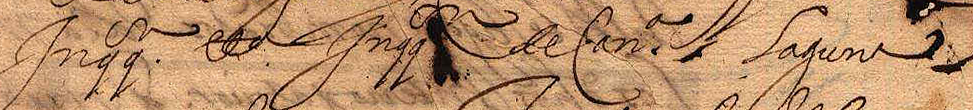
Jnqq.on eta Jnqqon de Can.a Laguna
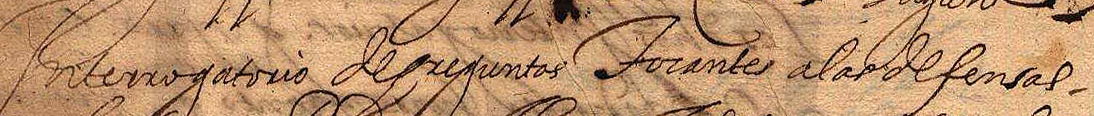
Jnterrogatorio de preguntas tocantes a las defensas
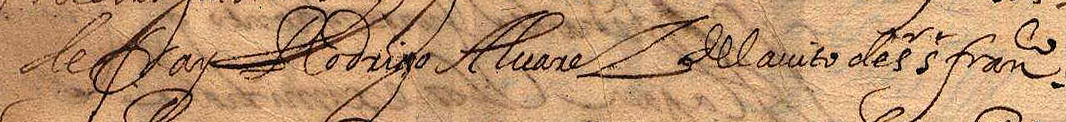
de fray Rodrigo AluareZ del auito de sr st fran.co
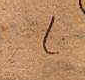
I
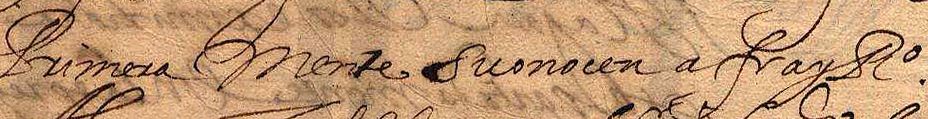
Primeramente si conocen a fray Ro.
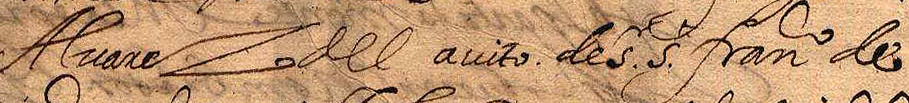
AluareZ del auito de s.r s.t fran.co de
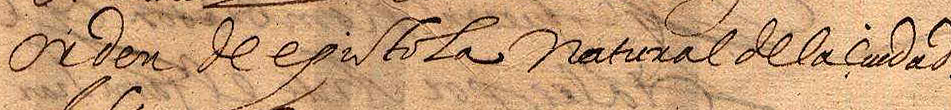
orden de epistola natural de la ciudad
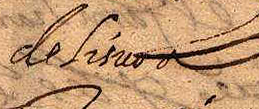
de lisuoa
